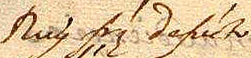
Ruy frz̄ defūcto
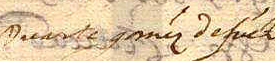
Duarte gomēz defūcto
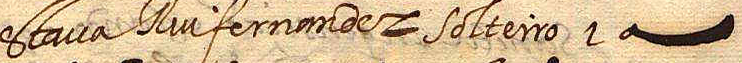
estaua Rui fernandez solteiro ia
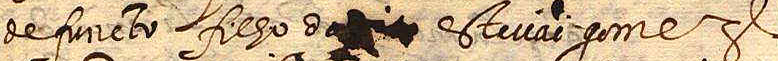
defuncto filho do _ esteuaõ gomez e
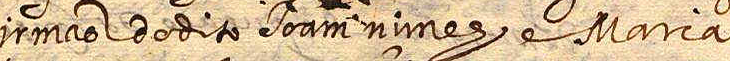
irmão do dito Ioam nunez e Maria
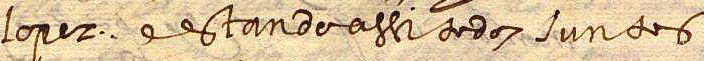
Lopez e estando ass̄i todos Iuntos
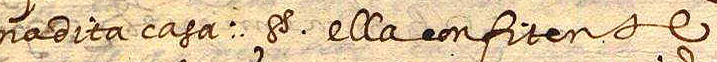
na dita casa .ss. ella confitente
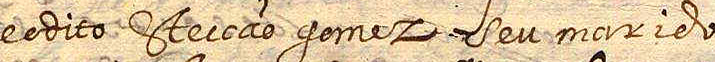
e o dito esteuão gomez seu marido
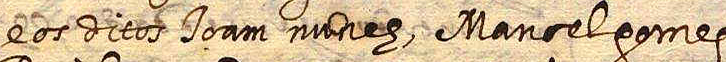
e os ditos Ioam nunez, Manoel gomez
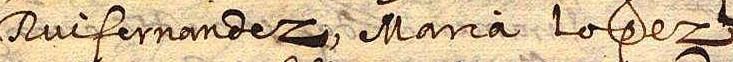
Rui fernandez, Maria Lopez
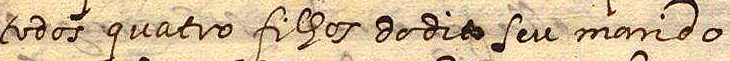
todos quatro filhos do dito seu marido
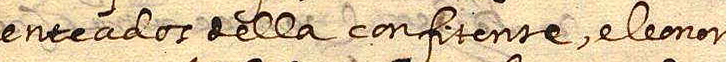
enteados della confitente, e leonor
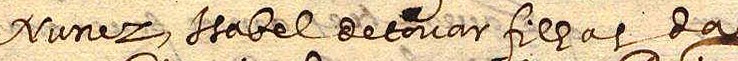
Nunez, Isabel de touar filhas da
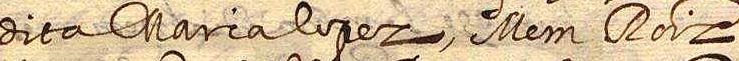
dita Maria lopez, Mem Roīz
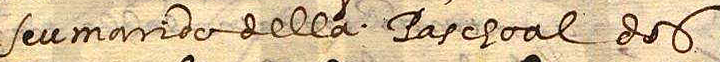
seu marido della paschoal dos
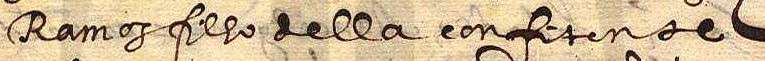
Ramos filho della confitente
